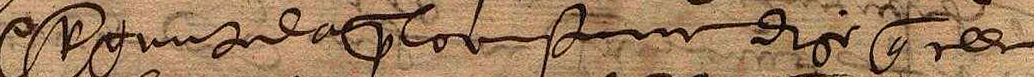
e ꝑguntada p̄lo custume dise q̄ ella
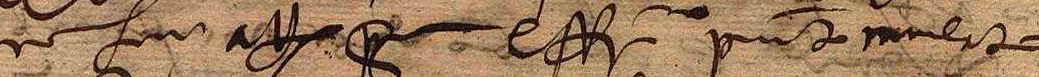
conhece a Rꝭ p̄sa e ffrco pinto mulato
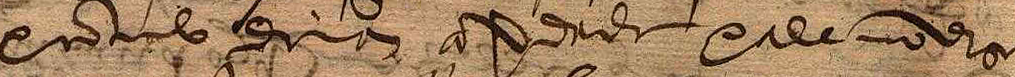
e cōtudo dira a ꝟdade e all nō dise
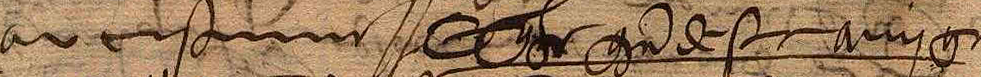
ao custume // E q̄ he grāde sua amjga
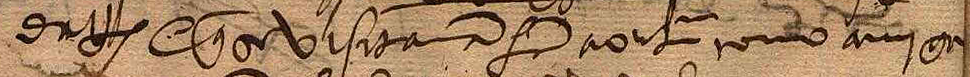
da Re e q̄ se visitauā huā a outra como amjga
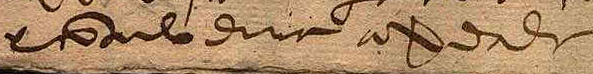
e cōtudo dira a ꝟdade
